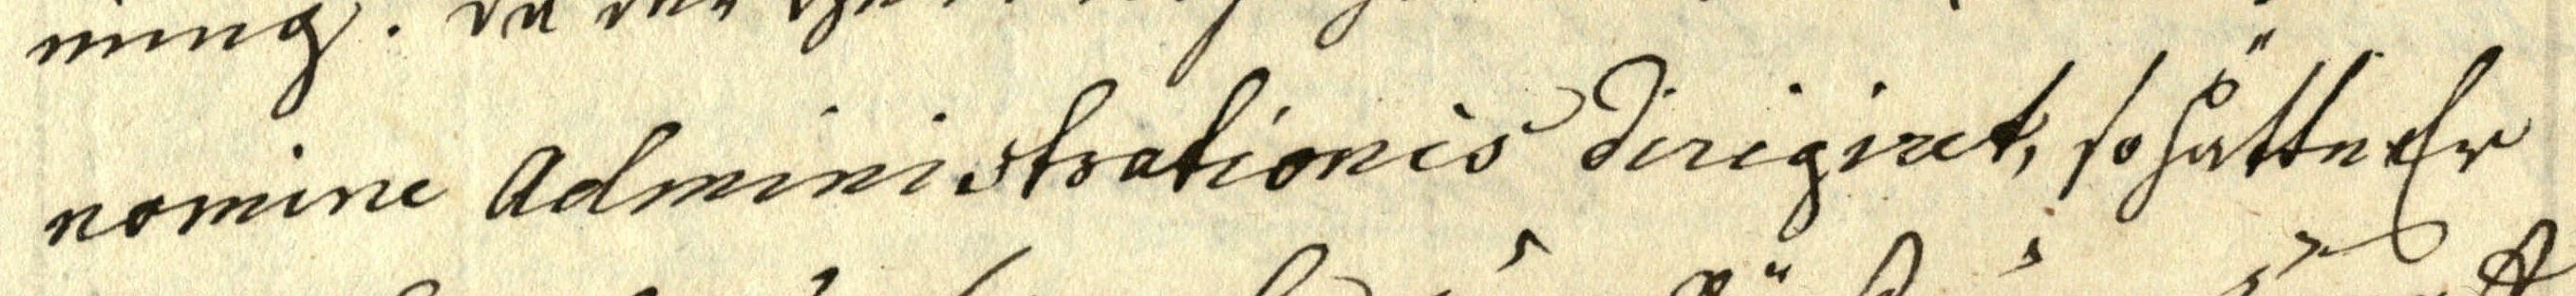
nomine Administrationis dirigiret, so hätte Er
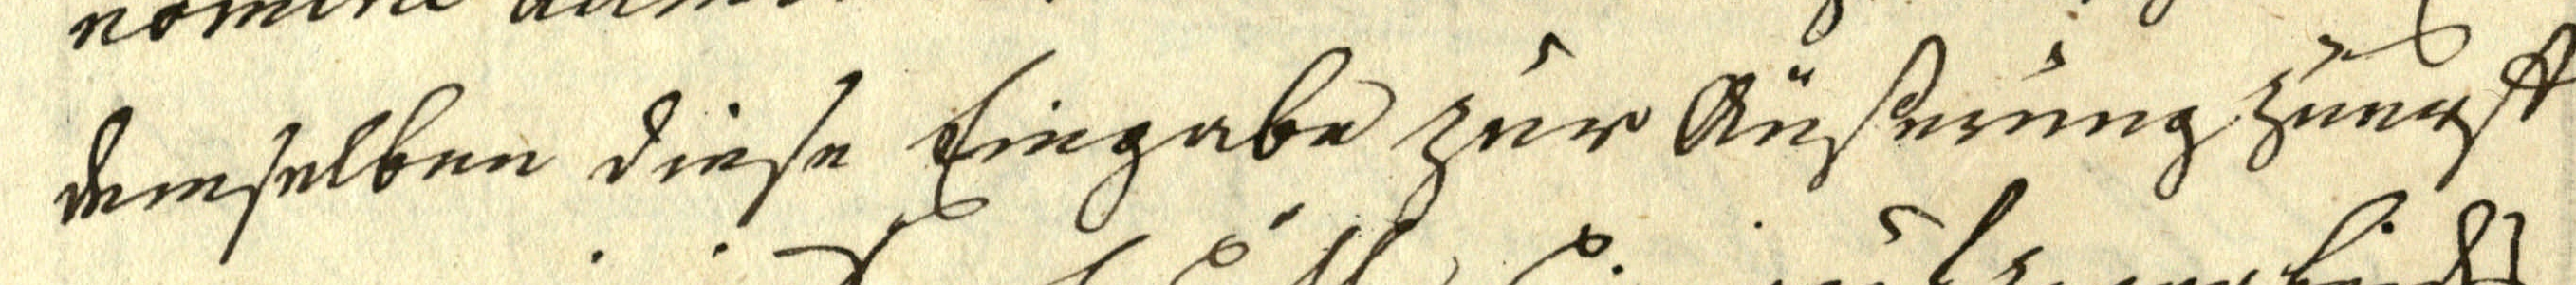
demselben diese Eingabe zur Äußerung zuerst
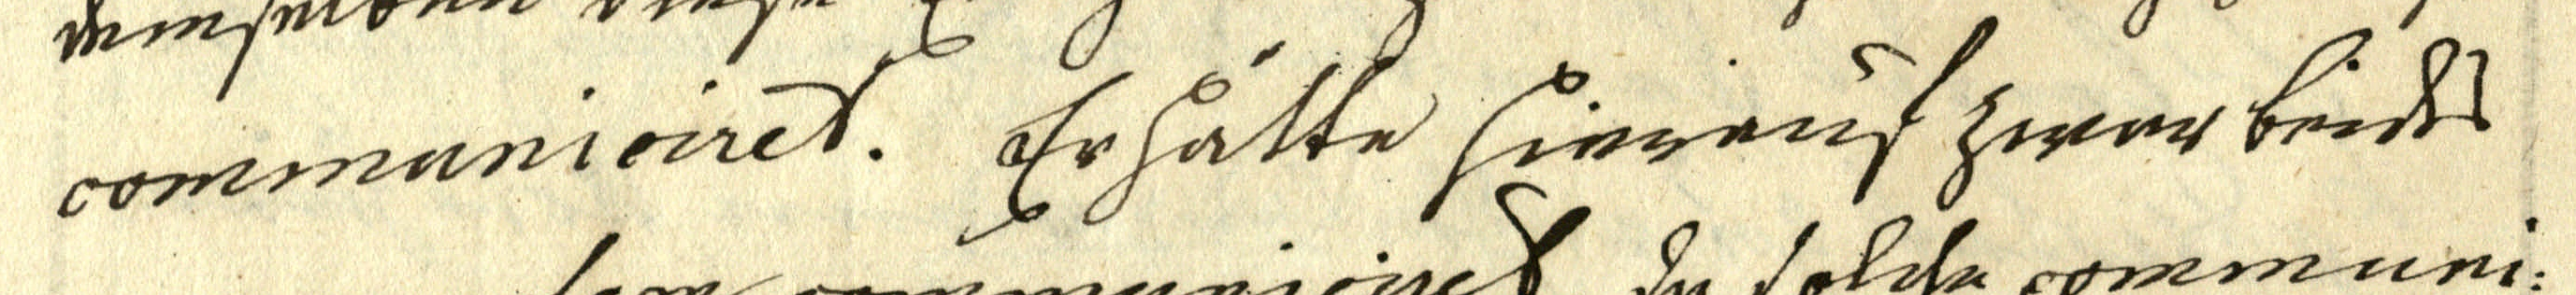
communiciret. Er hätte hierauf zwar beides
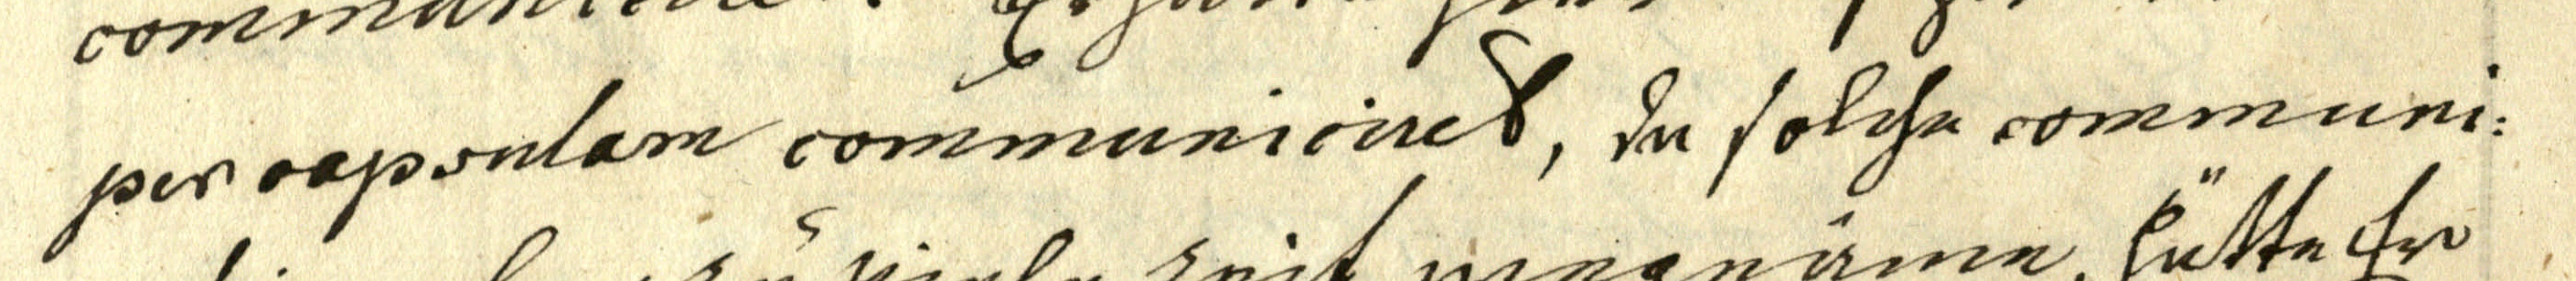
per capsulam communiciret, da solche communi¬
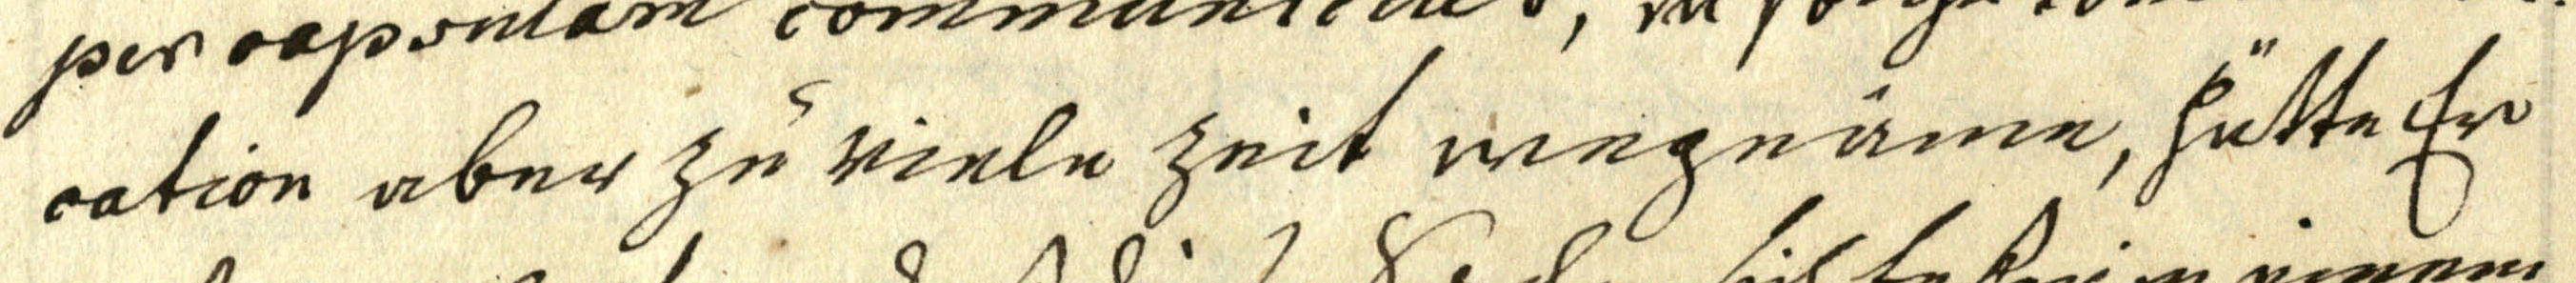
cation aber zu viele Zeit wegnäme, hätte Er
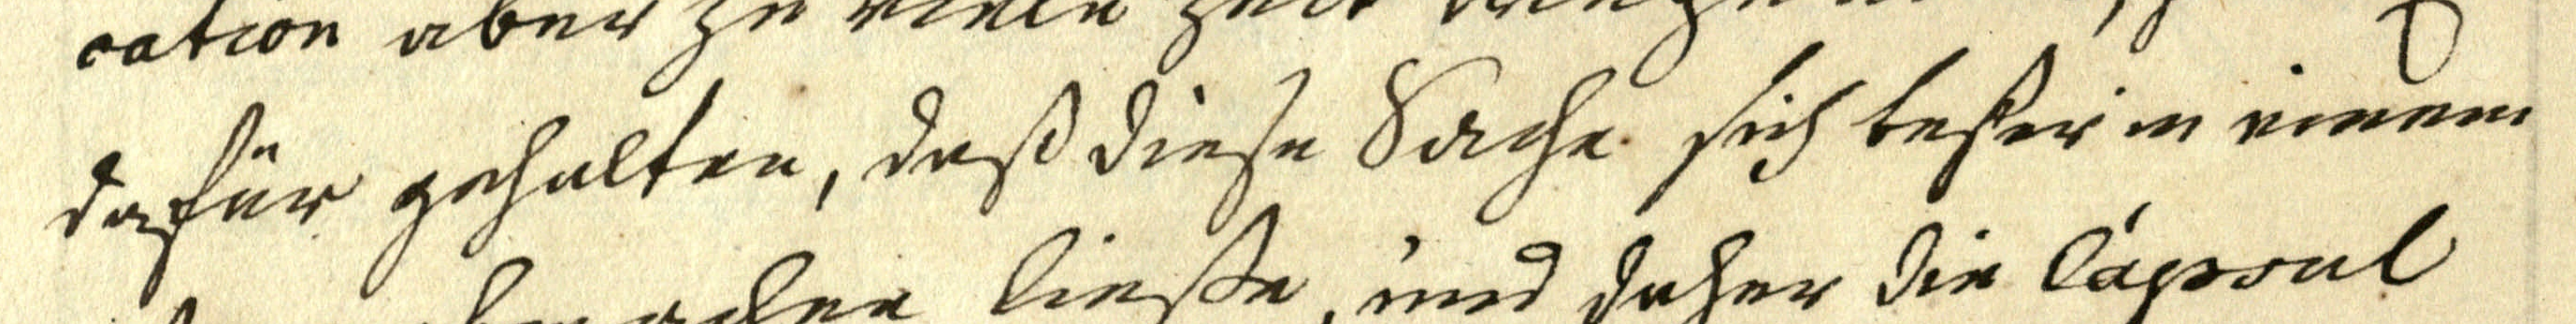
dafür gehalten, daß diese Sache sich beßer in einem
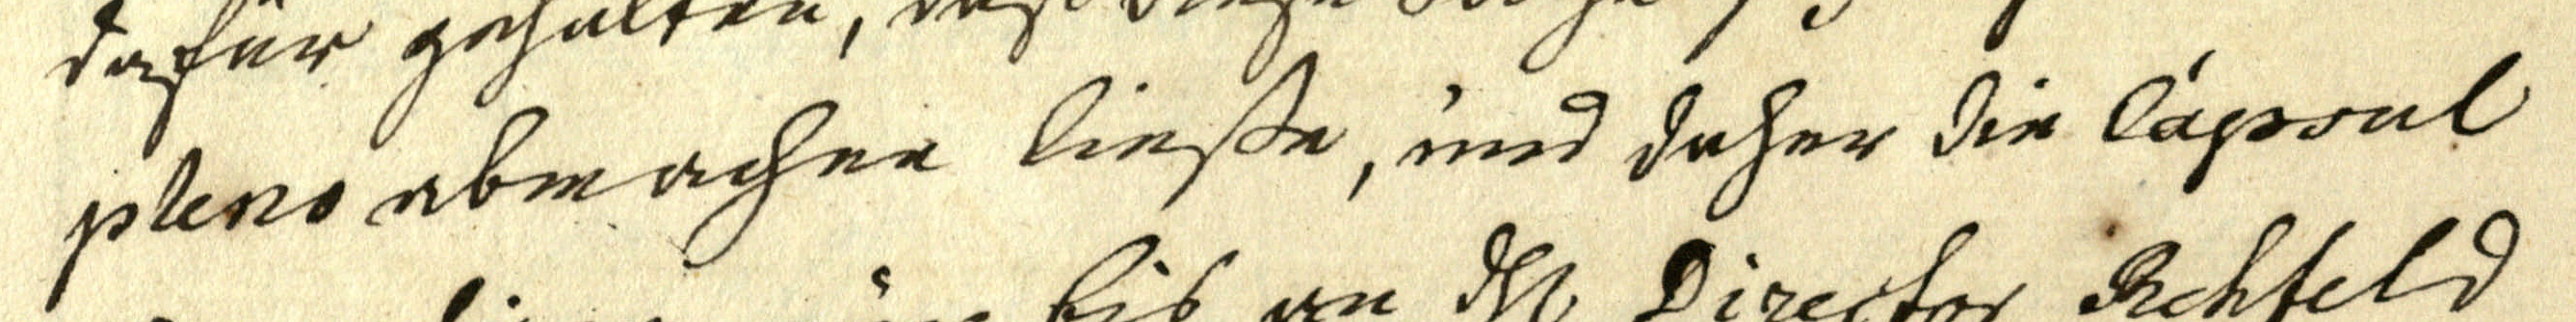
pleno abmachen ließe, und daher die Capsul
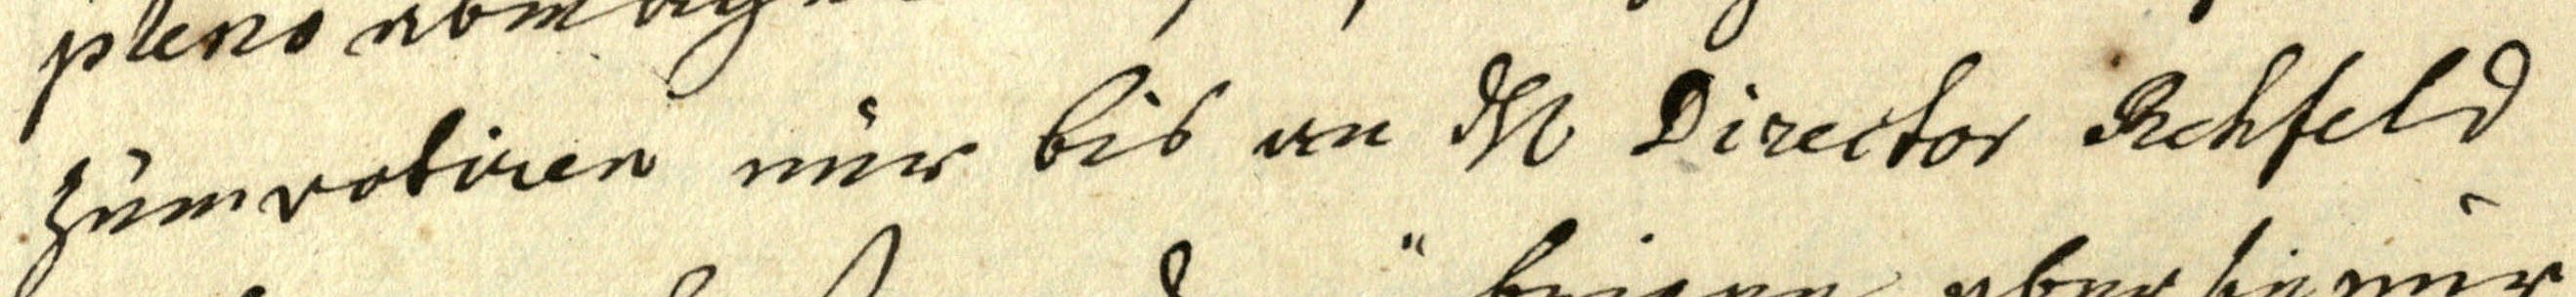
zum votiren nur bis an dh Director Rehfeld
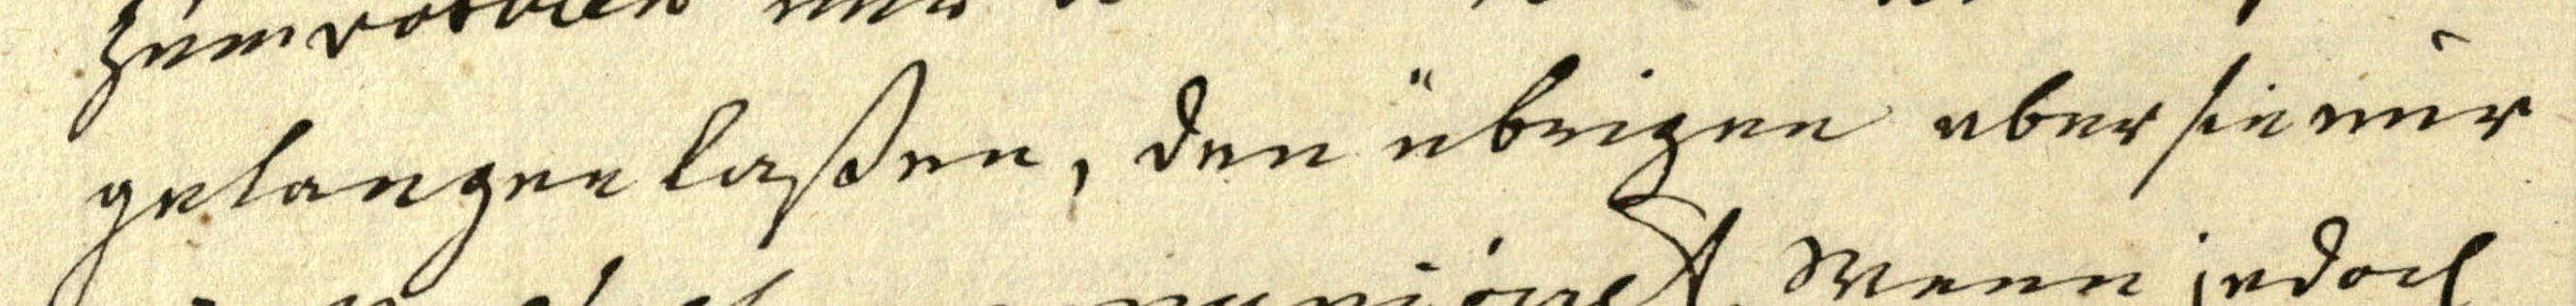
gelangen laßen, den übrigen aber sie nur
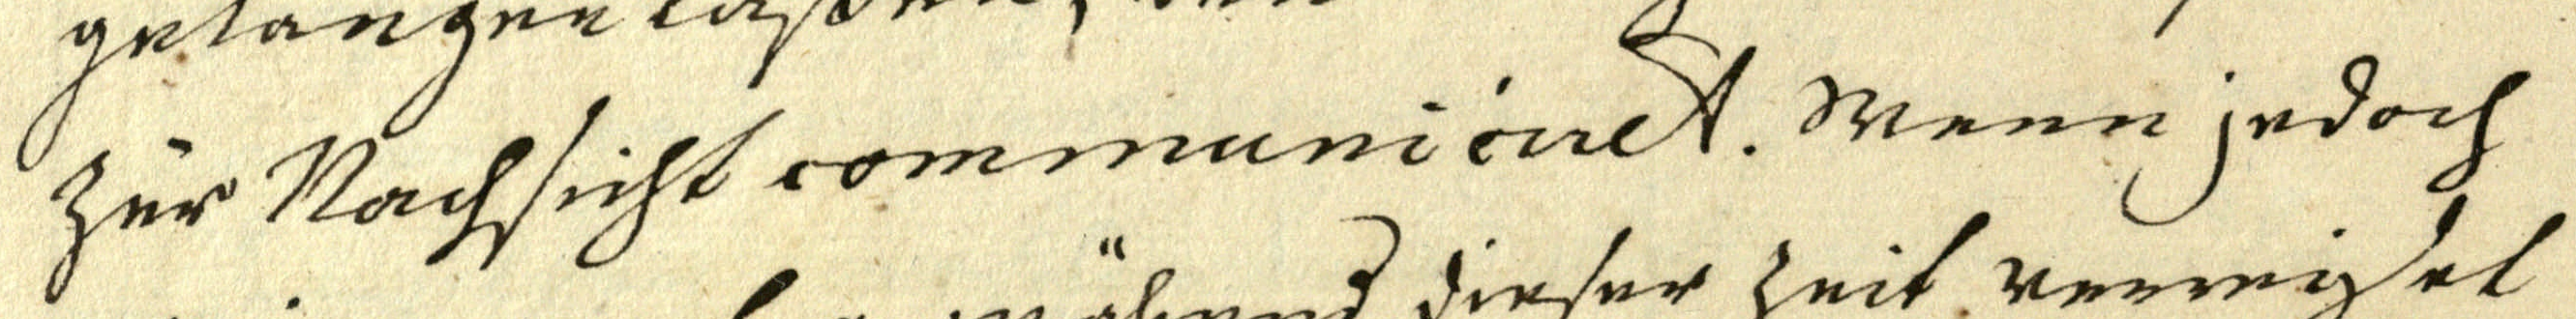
zur Nachsicht communiciret. Wenn jedoch
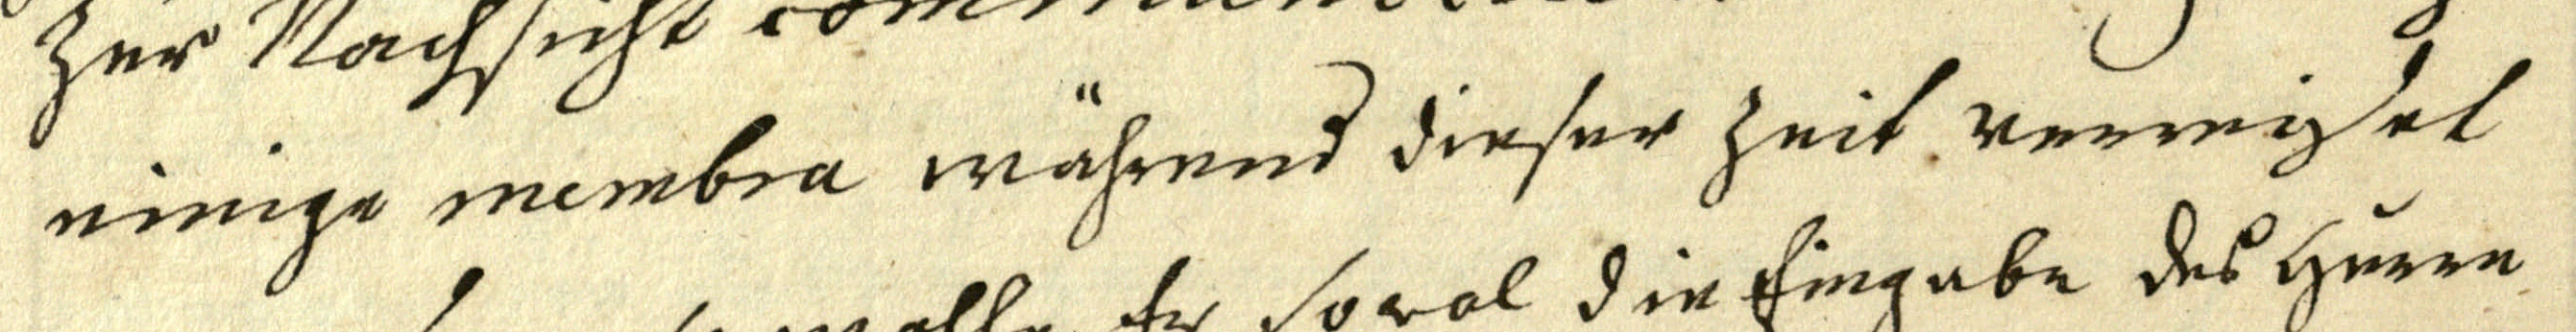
einige membra während dieser Zeit verreiset
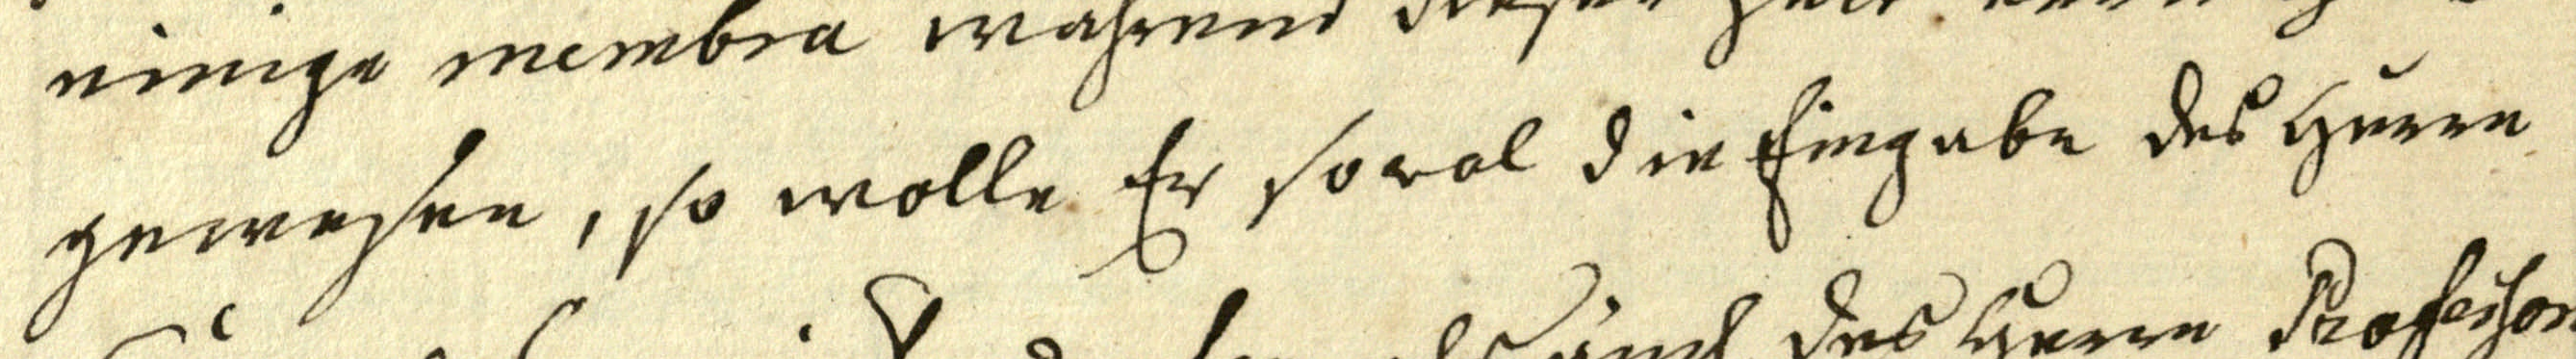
gewesen, so wolle Er so wol die Eingabe des Herrn
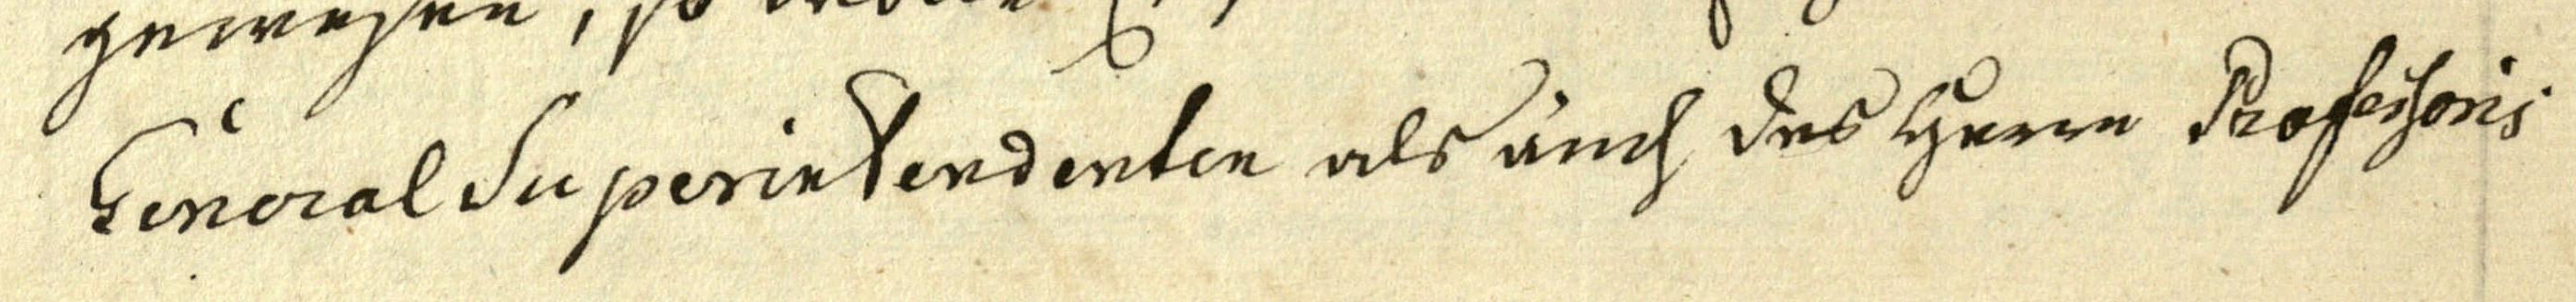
General Superintendenten als auch des Herrn Professoris
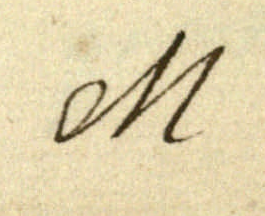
M
